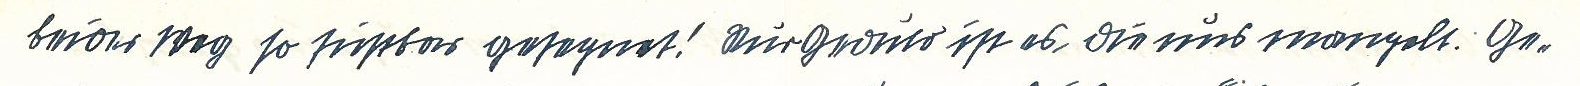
beider Weg so sichtbar gesegnet! Nur Geduld ist es, die uns mangelt. Ge¬
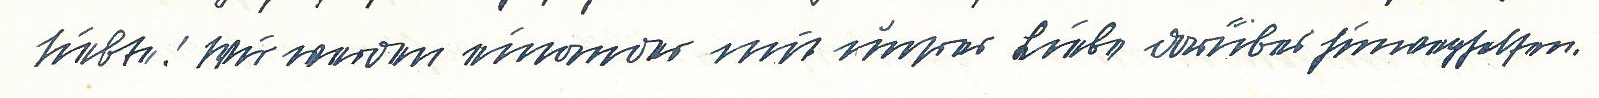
liebte! Wir werden einander mit unsrer Liebe darüber hinweghelfen.
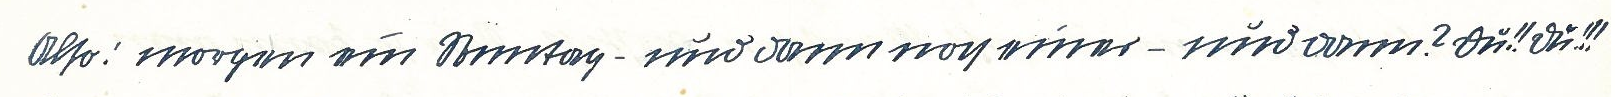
Also: morgen ein Sonntag – und dann noch einer – und dann? Du!! Du!!!
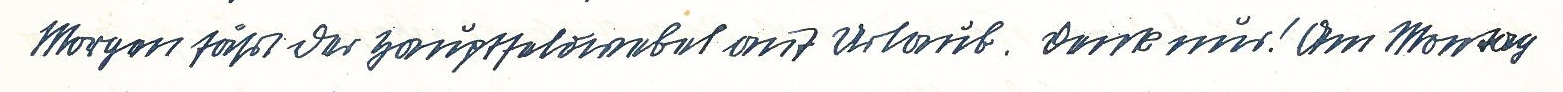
morgen fährt der Hauptfeldwebel auf Urlaub. Denk nur! Am Montag
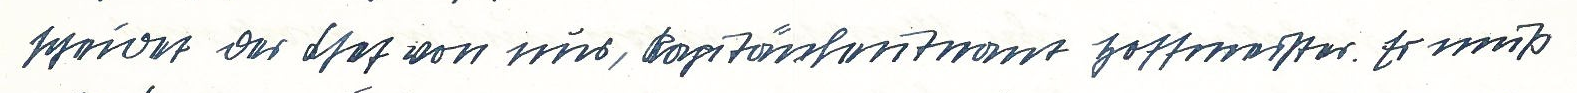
scheidet der Chef von uns, Kapitänleutnant H. Er muß
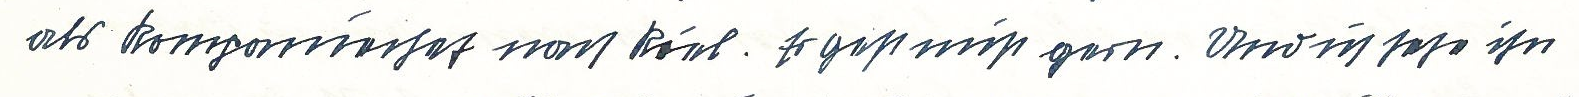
als Kompaniechef nach Kiel. Er geht nicht gern. Und ich sehe ihn
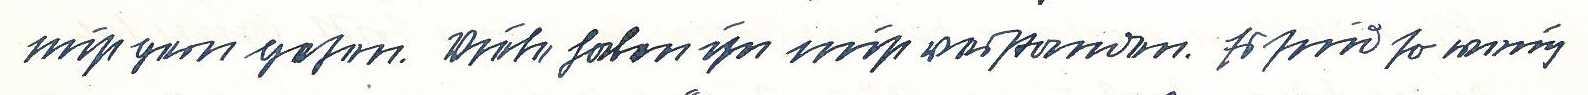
nicht gern gehen. Viele haben ihn nicht verstanden. Es sind so wenig
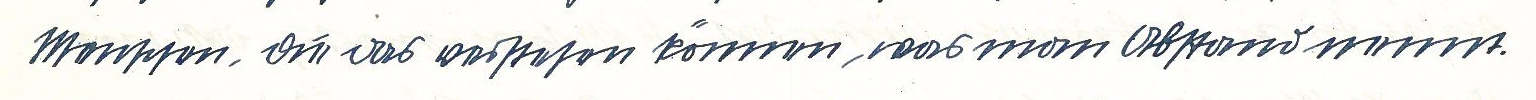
Menschen, die das verstehen können, was man Abstand nennt.
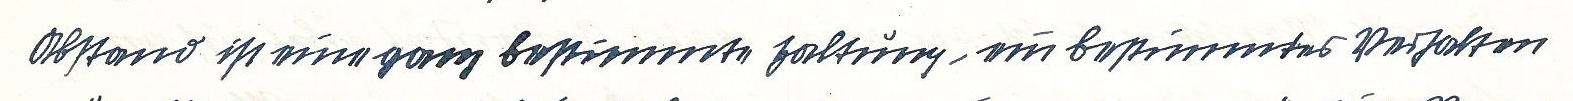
Abstand ist eine ganz bestimmte Haltung, ein bestimmtes Verhalten
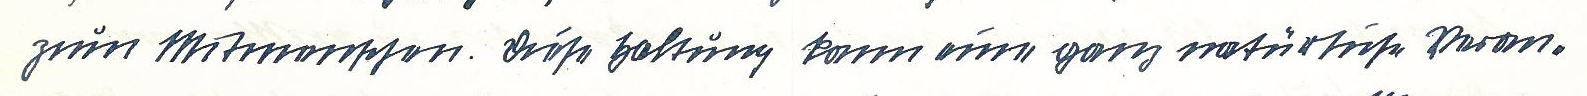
zum Mitmenschen. Diese Haltung kann eine ganz natürliche Veran¬
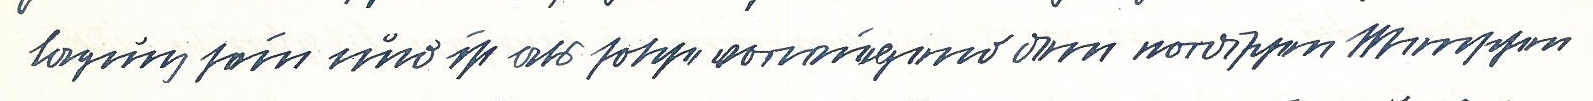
lagung sein und ist als solche vorwiegend dem nordischen Menschen
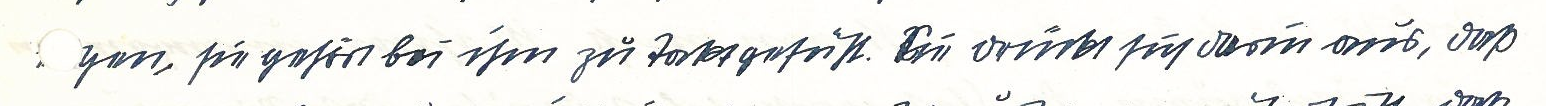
gen, sie gehört bei ihm zu Taktgefühl. Sie drückt sich darin aus, daß
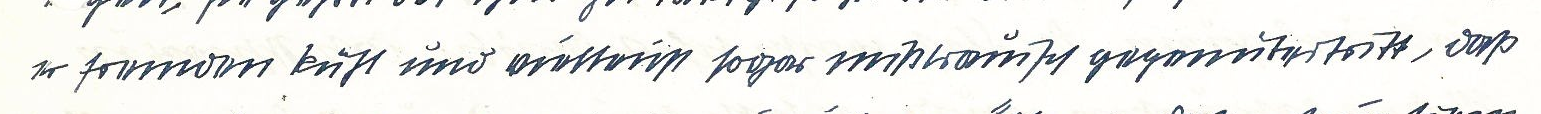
er Fremden kühl und vielleicht sogar mißtrauisch gegenübertritt, daß
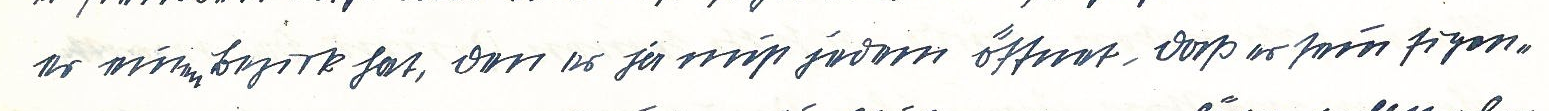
er einen Bezirk hat, den er ja nicht jedem öffnet, daß er sein Eigen¬
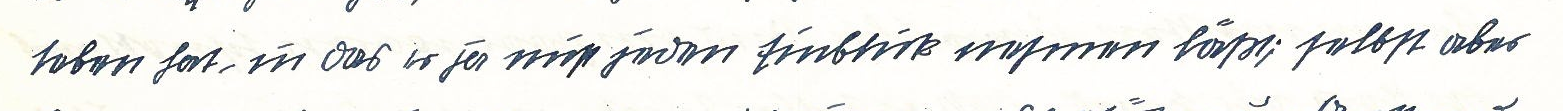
leben, in das er ja nicht jedem Einblick nehmen läßt; selbst aber
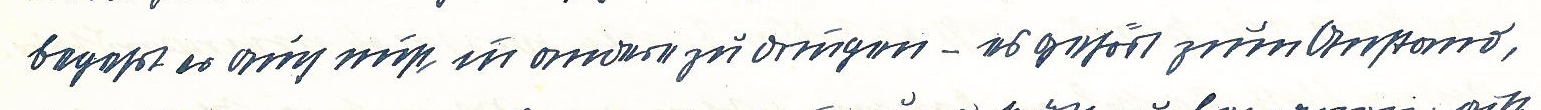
begehrt er auch nicht, in andere zu dringen – es gehört zum Anstand,
